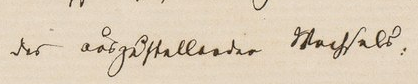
des auszustellenden Wechsels.
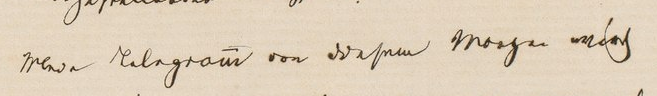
Mein Telegramm von diesem Morgen wird
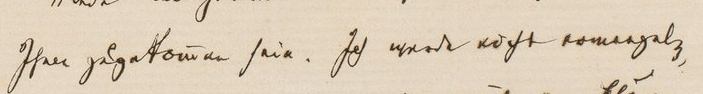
Ihnen zugekommen sein. Ich werde nicht ermangeln,
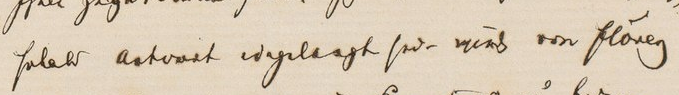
sobald Antwort eingelangt sei, wird von Florenz,
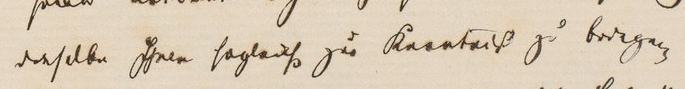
dieselbe Ihnen sogleich zu Kenntniß zu bringen
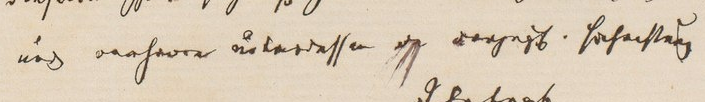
und verharre unterdessen in vorzügl. Hochachtung
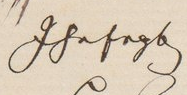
Ihr Ergbener
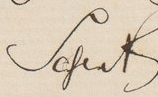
Schenk.
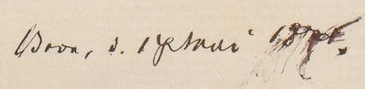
Bern, d. 18 Mai 1871.
